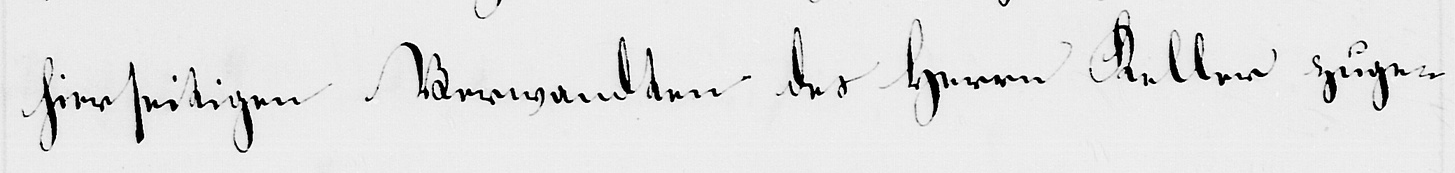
hierseitigen Verwandten des Herrn Keller zuge¬
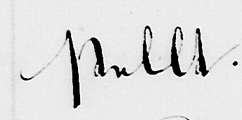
stellt.
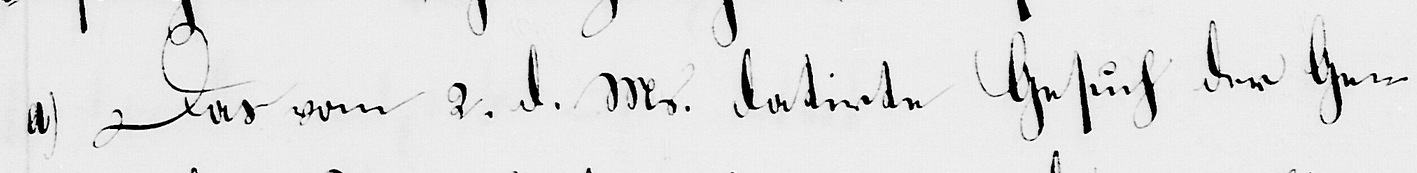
a.) Das vom 2. d. Ms. datirte Gesuch der Ge¬
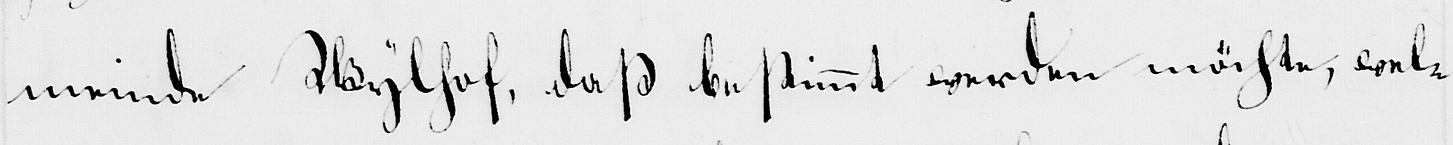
meinde Wylhof, daß bestimmt werden möchte, wel¬
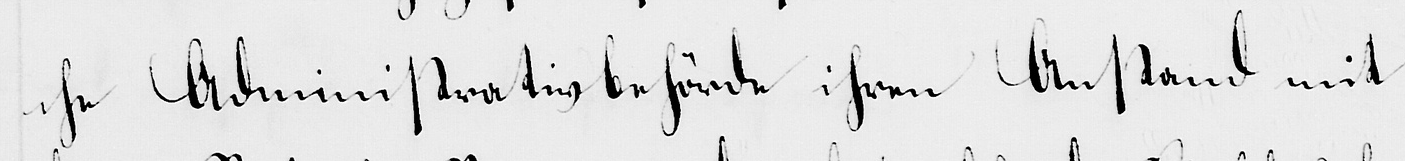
che Administrativbehörde ihren Anstand mit
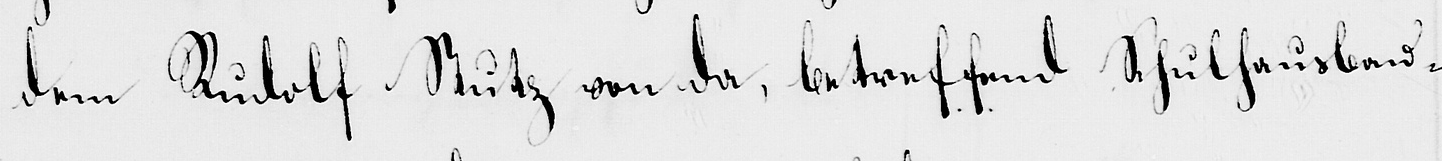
dem Rudolf Stutz von da, betreffend Schulhausbau¬
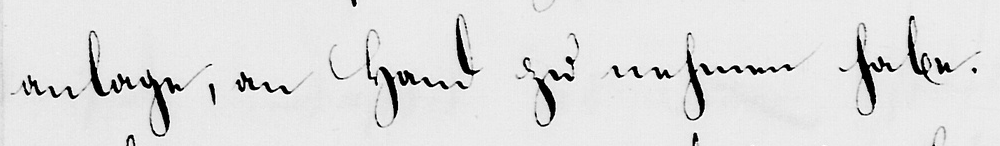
anlage, an Hand zu nehmen habe.
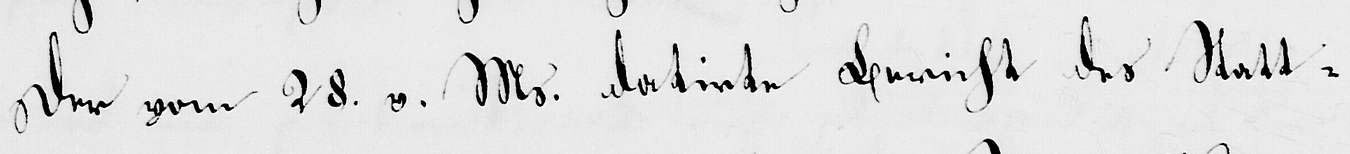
der vom 28. v. Ms. datirte Bericht des Statt¬
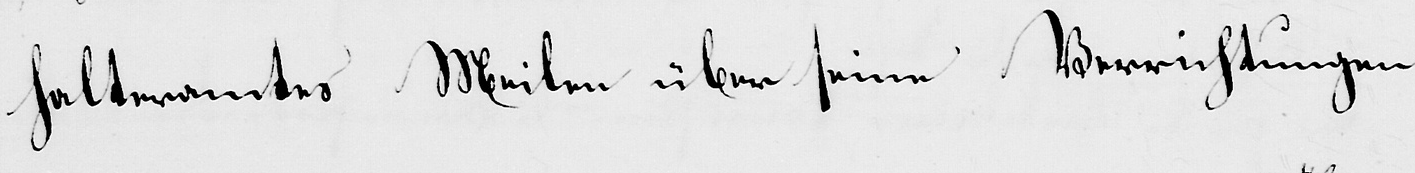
halteramtes Meilen über seine Verrichtungen
